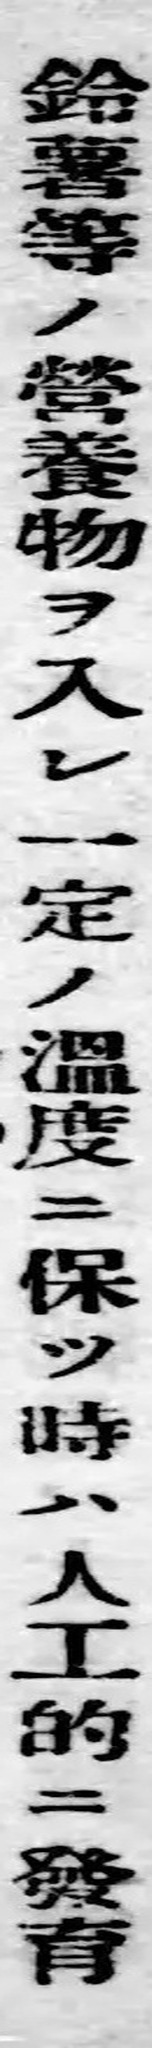鈴薯等ノ營養物ヲ入レ一定ノ溫度ニ保ツ時ハ人工的ニ發育
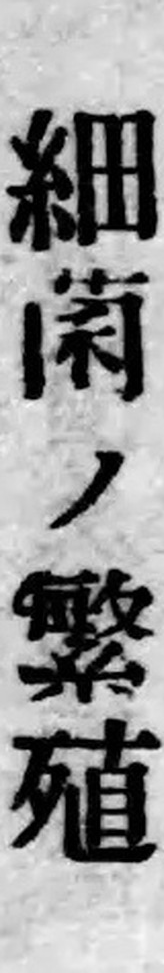細菌ノ繁殖

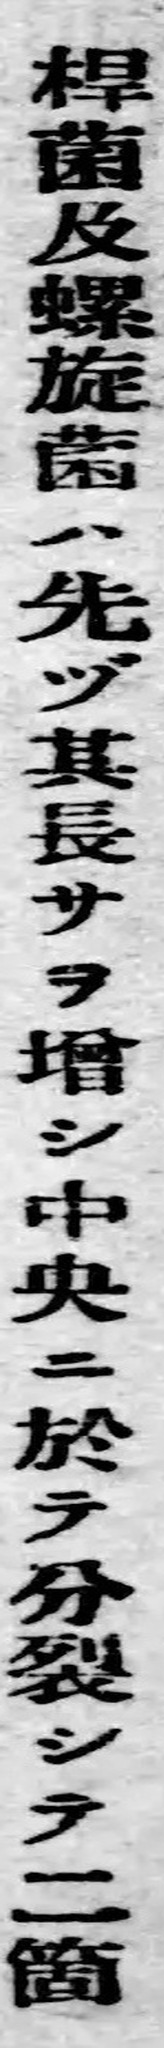桿菌及螺旋菌ハ先ヅ其長サヲ增シ中央ニ於テ分裂シテ二箇
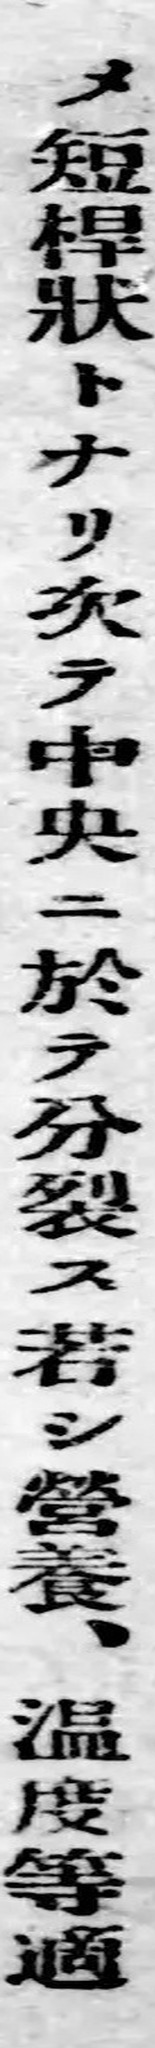メ短桿狀トナリ次テ中央ニ於テ分裂ス若シ營養、温度等適
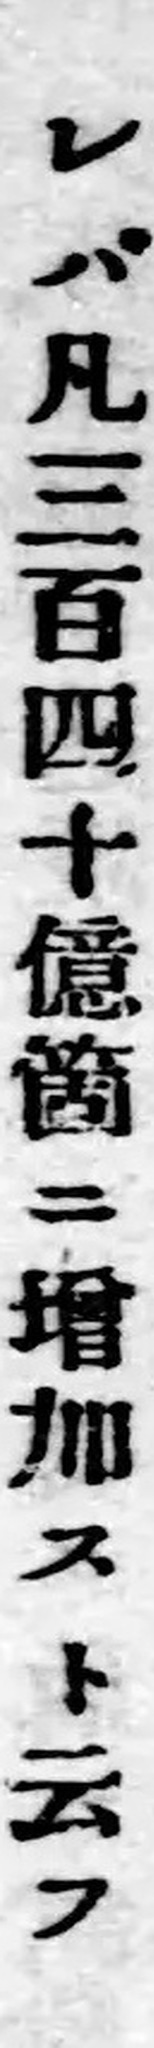レバ凡三百四十億箇ニ增加スト云フ
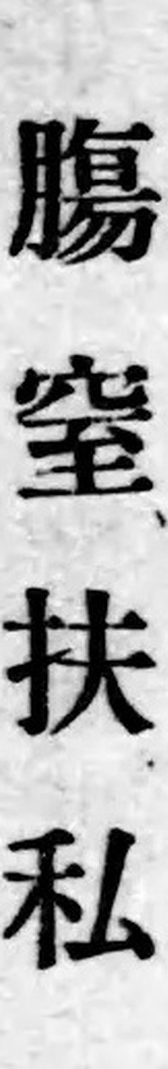膓窒扶私
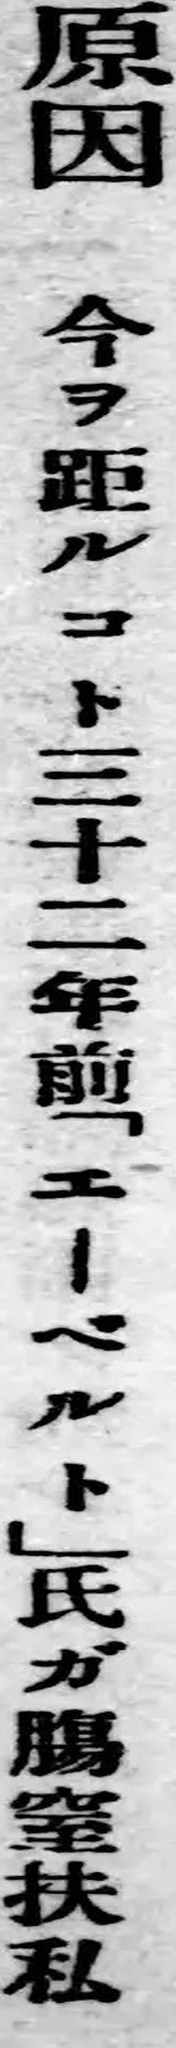原因今ヲ距ルコト三十二年前「エーベルト」氏ガ膓窒扶私
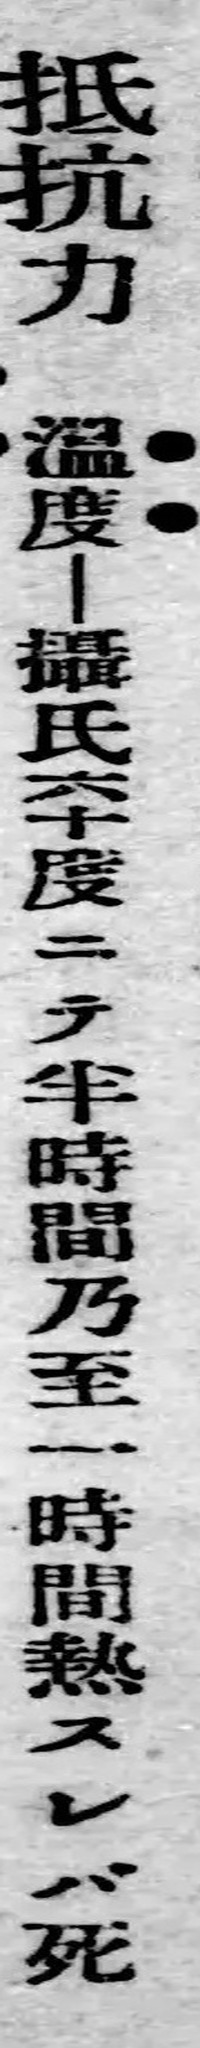抵抗力温度―攝氏六十度ニテ半時間乃至一時間熱スレバ死
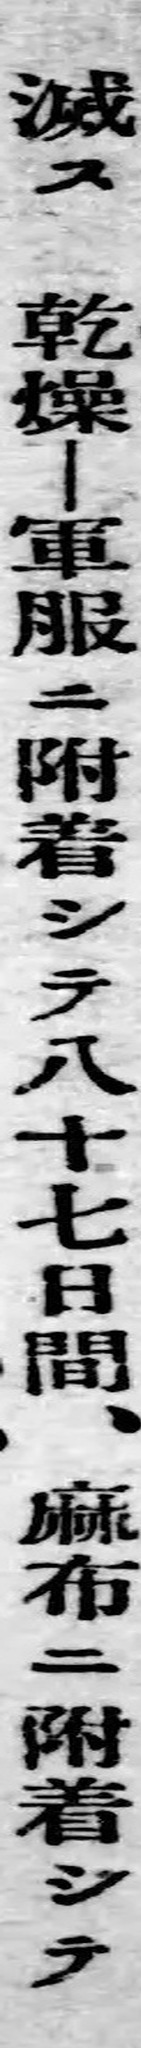滅ス乾燥―軍服ニ附着シテ八十七日間、麻布ニ附着シテ
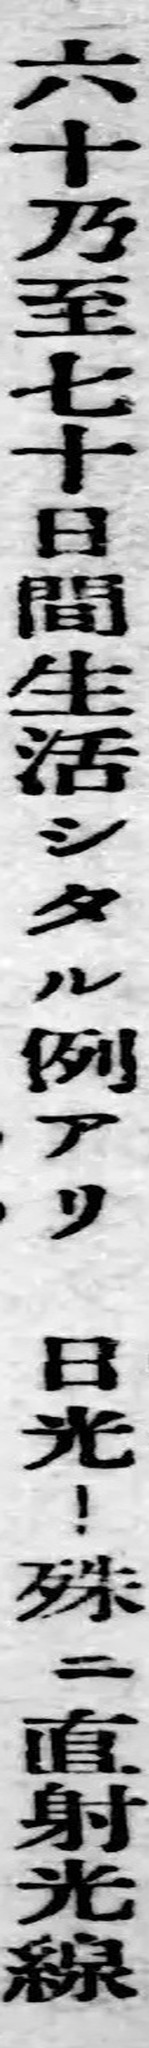六十乃至七十日間生活シタル例アリ日光―殊ニ直射光線
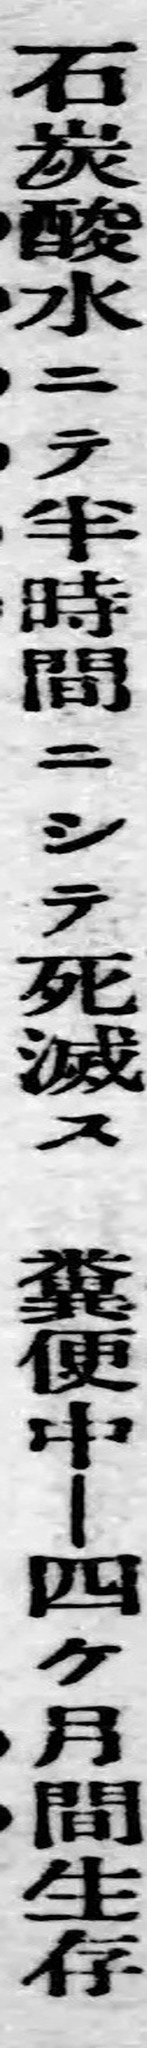石炭酸水ニテ半時間ニシテ死滅ス糞便中―四ヶ月間生存
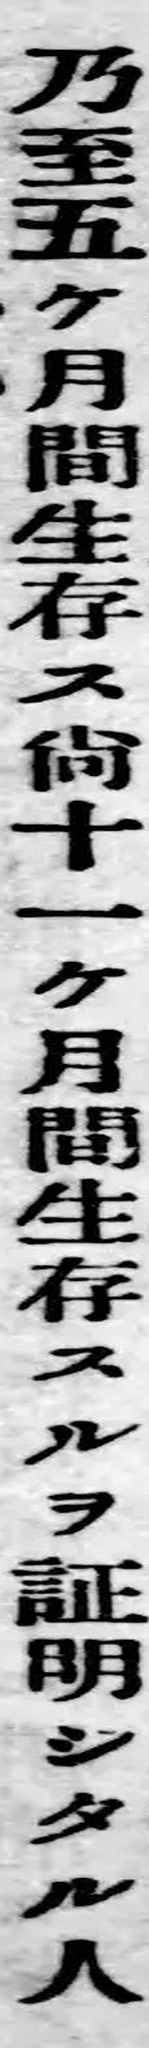乃至五ヶ月間生存ス尚十一ヶ月間生存スルヲ証明シタル人
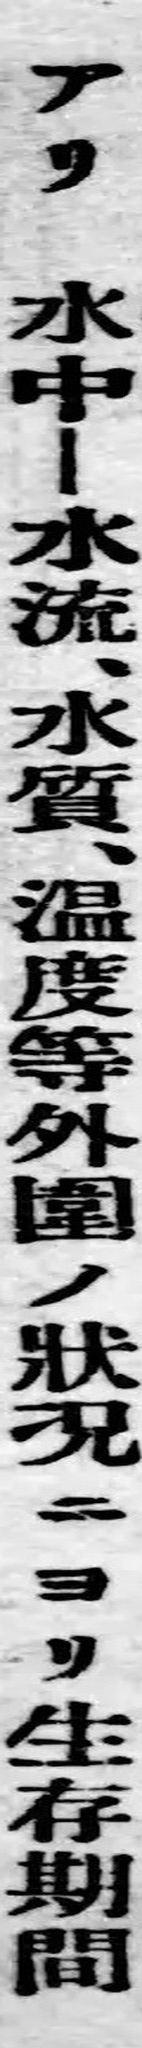アリ水中―水流、水質、温度等外圍ノ狀況ニヨリ生存期間
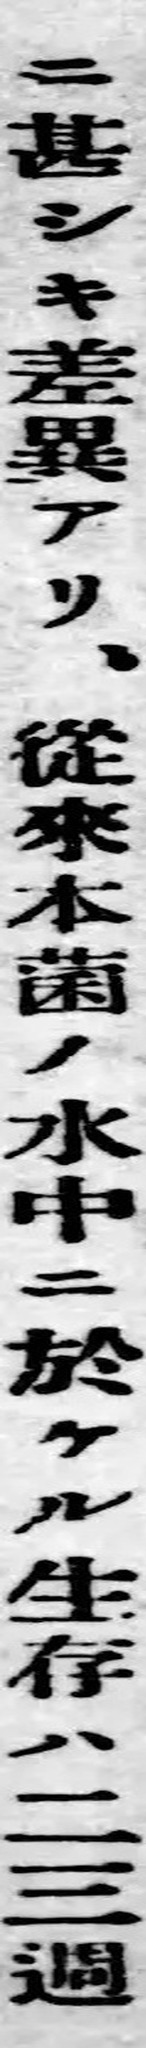ニ甚シキ差異アリ、從來本菌ノ水中ニ於ケル生存ハ二三週
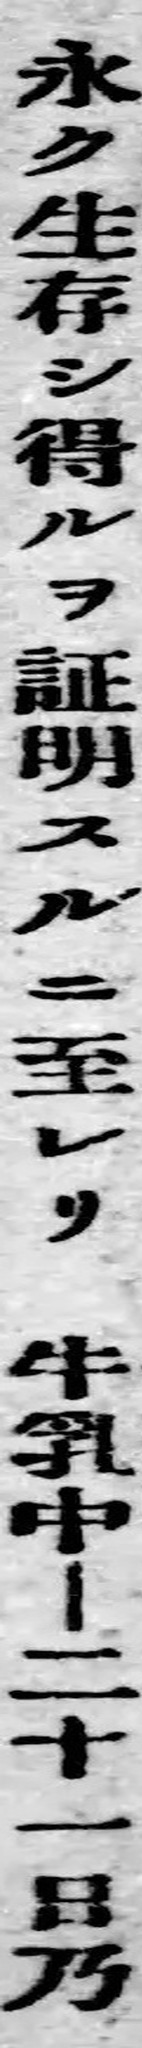永ク生存シ得ルヲ証明スルニ至レリ牛乳中―二十一日乃
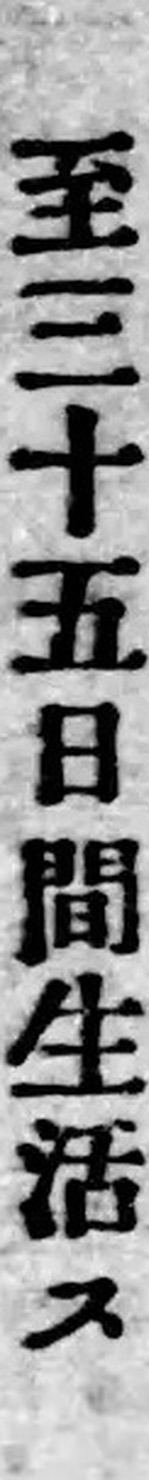至三十五日間生活ス
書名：袖珍防疫必携
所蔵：国立国会図書館 National Diet Library, JAPAN
